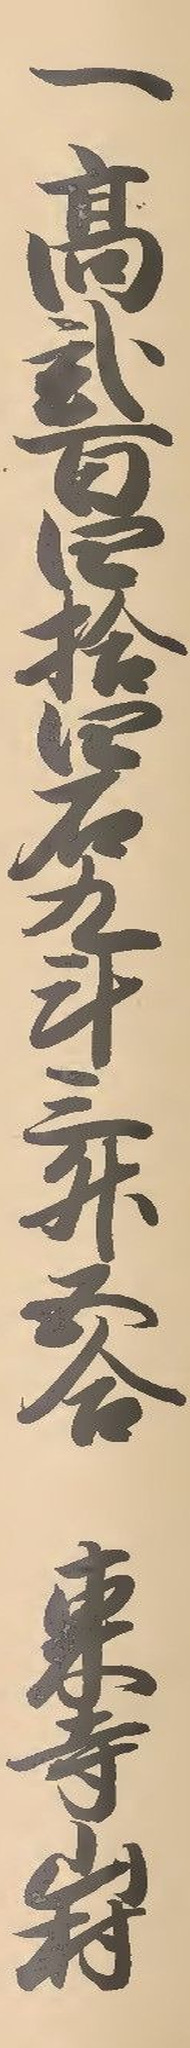一高弐百四拾四石九斗三升五合東寺山村
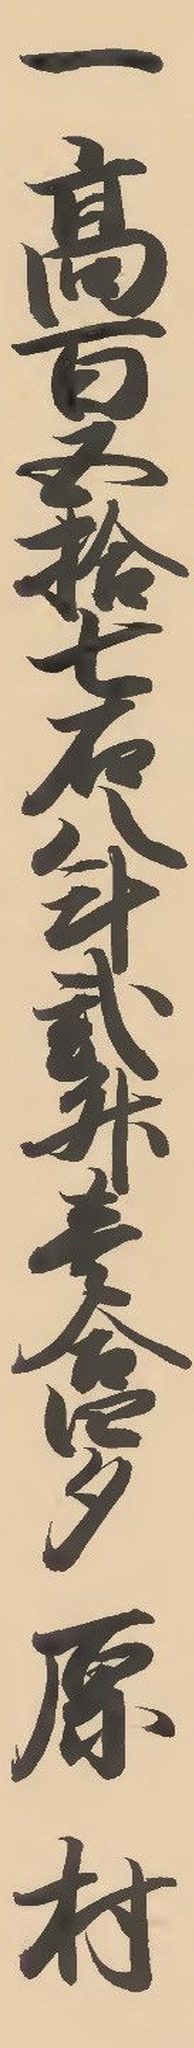一高百五拾七石八斗弐升壱合四勺原村
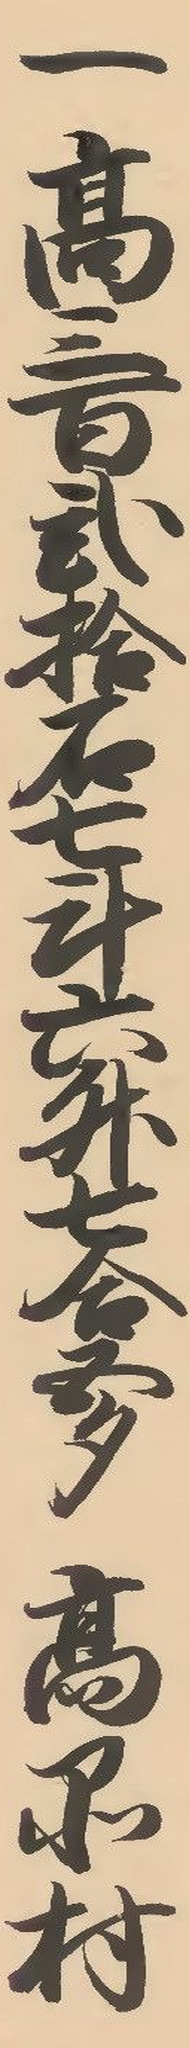一高三百弐拾石七斗六升七合五勺高品村
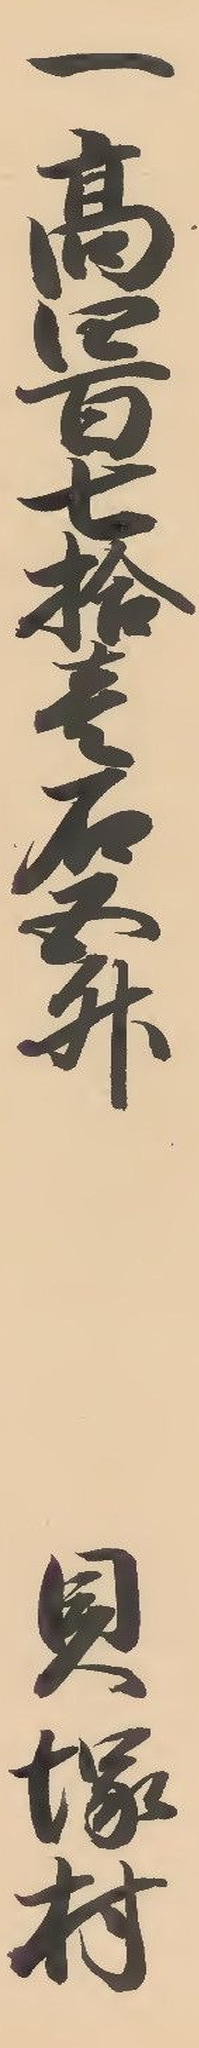一高四百七拾壱石五升貝塚村

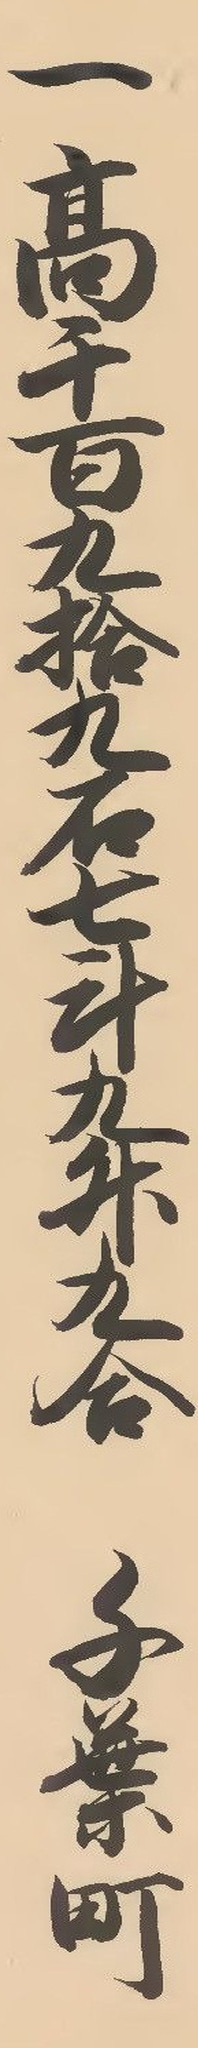一高千百九拾九石七斗九升九合千葉町
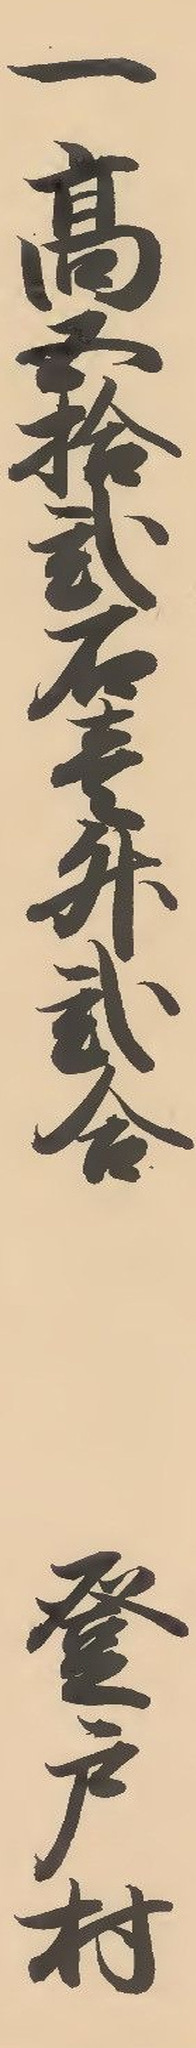一高五拾弐石壱升弐合登戸村
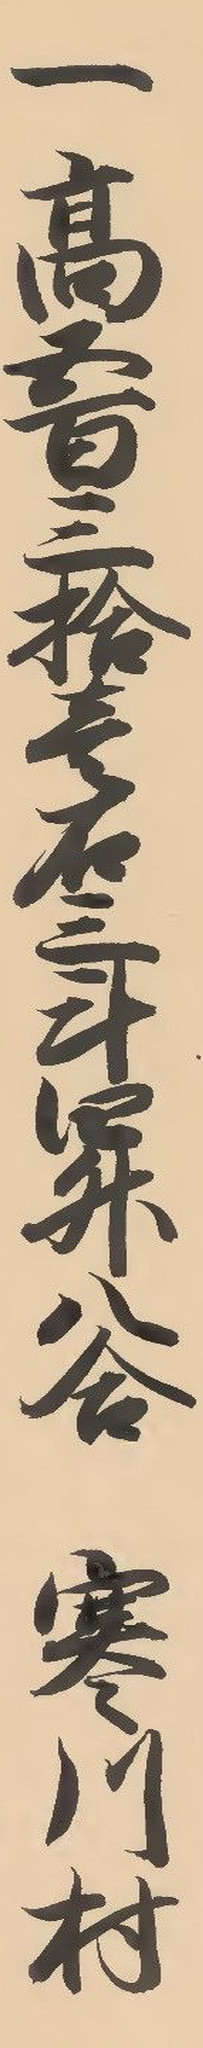一高五百三拾壱石三斗四升八合寒川村
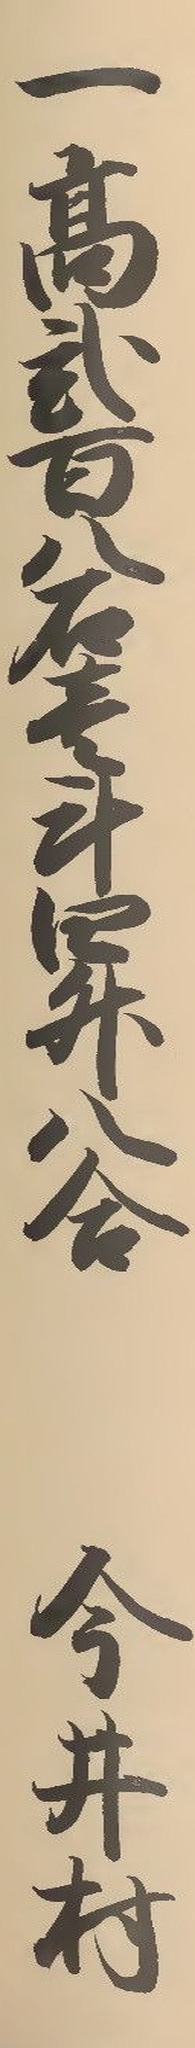一高弐百八石壱斗四升八合今井村
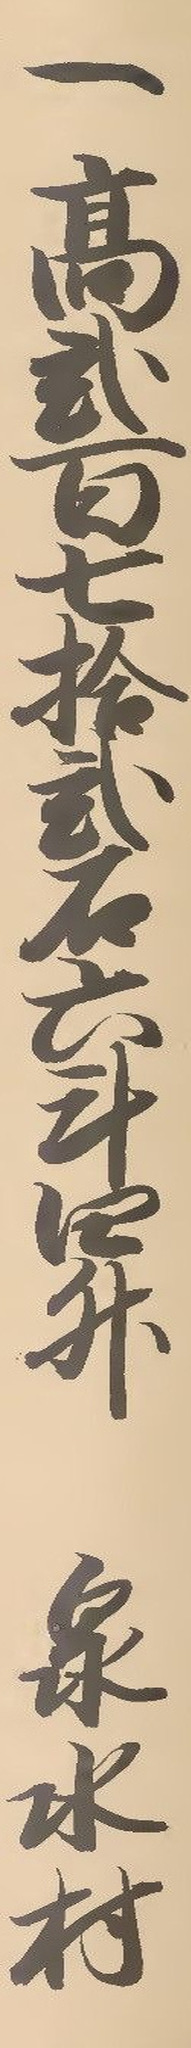一高弐百七拾弐石六斗四升泉水村
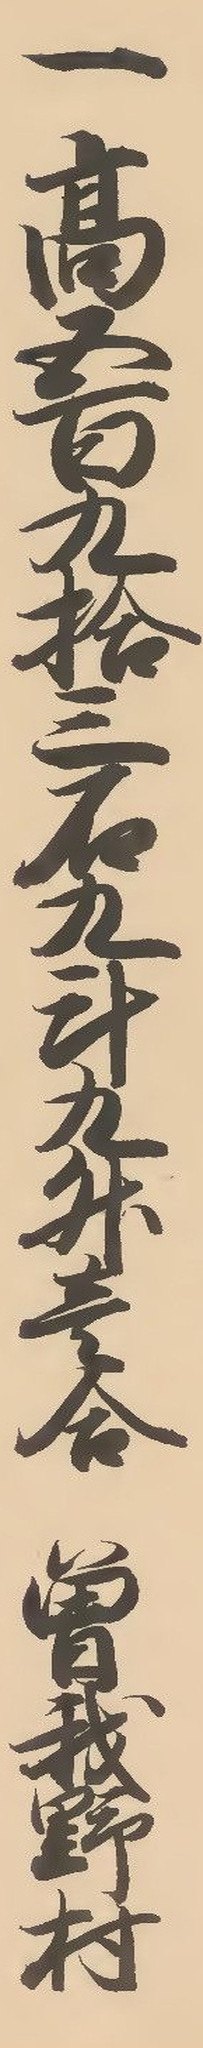一高五百九拾三石九斗九升壱合曽我野村
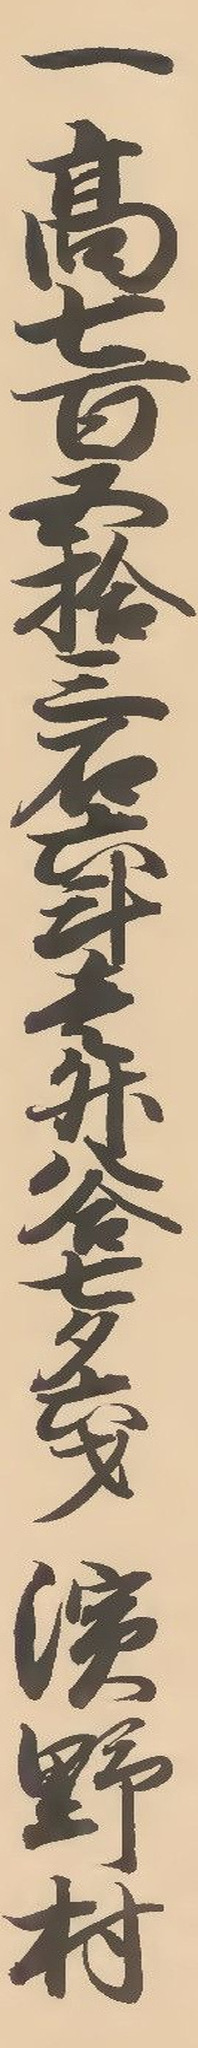一高七百五拾三石六斗壱升八合七勺六才浜野村
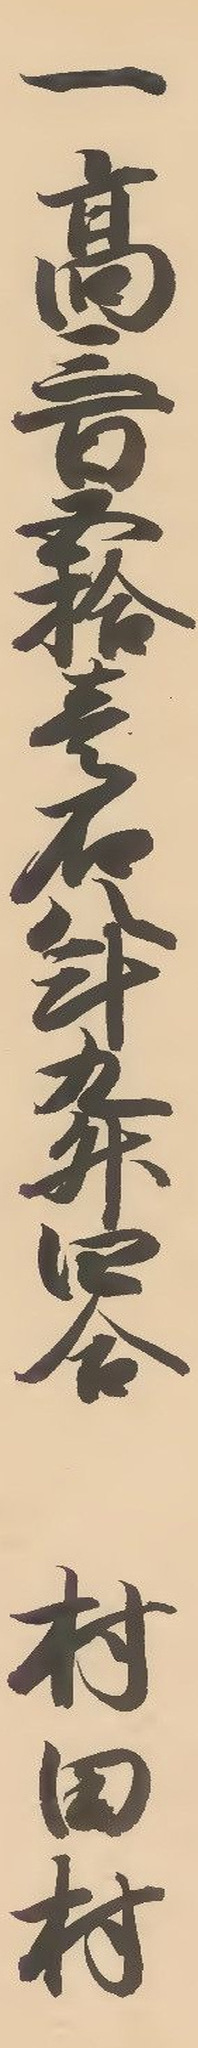一高三百五拾壱石八斗九升四合村田村

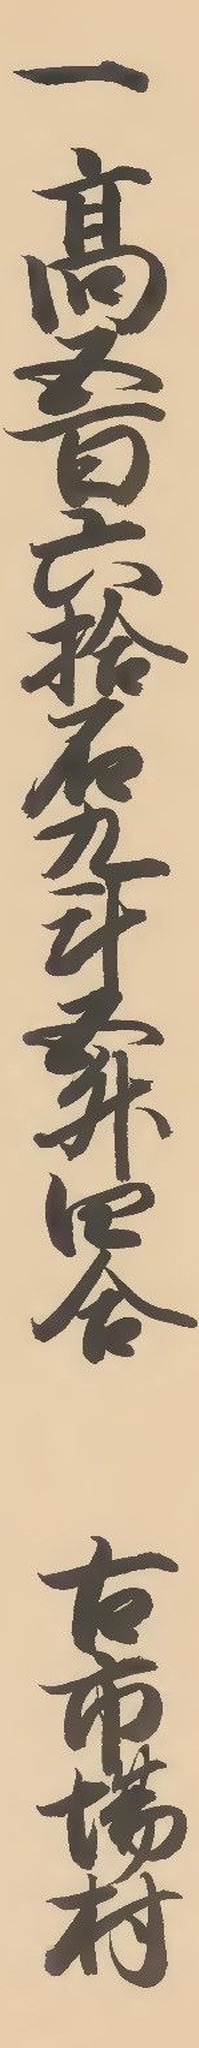一高五百六拾石九斗五升四合古市場村
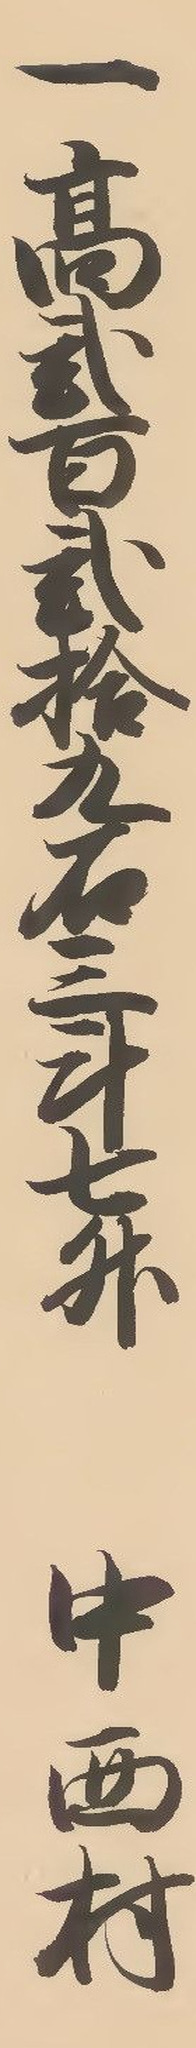一高弐百弐拾九石三斗七升中西村
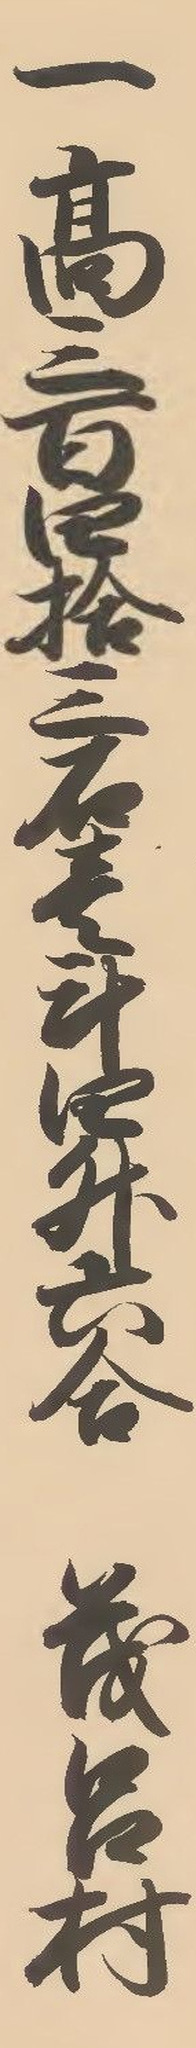一高三百四拾三石壱斗四升六合茂呂村
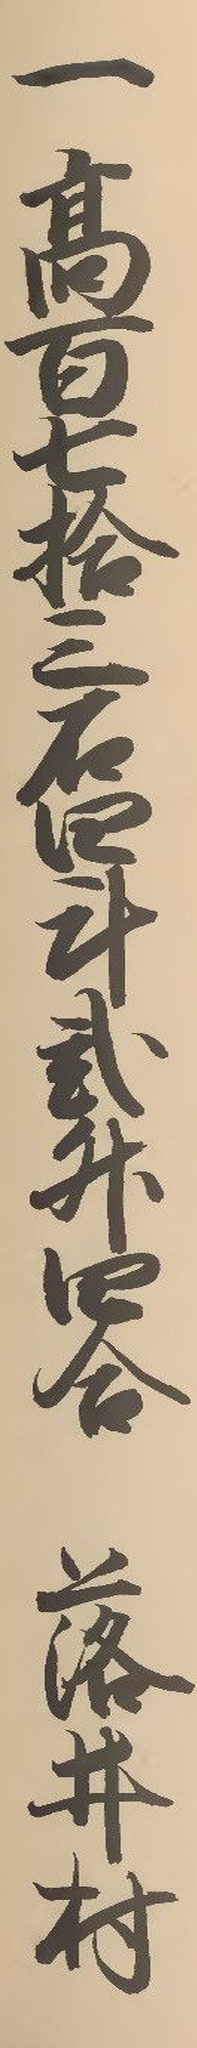一高百七拾三石四斗弐升四合落井村
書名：下総国郷帳
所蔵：国立公文書館 National Archives of Japan
